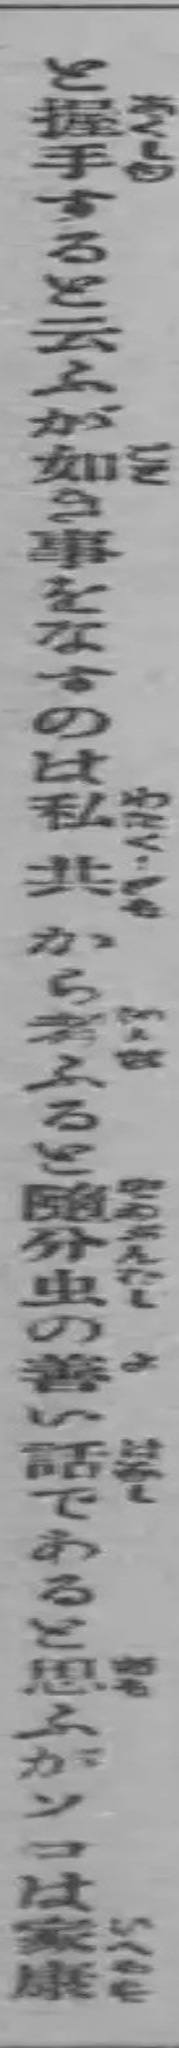と握手すると云ふが如き事をなすのは私共から考ふると随分虫の善い話であると思ふがソコは家康

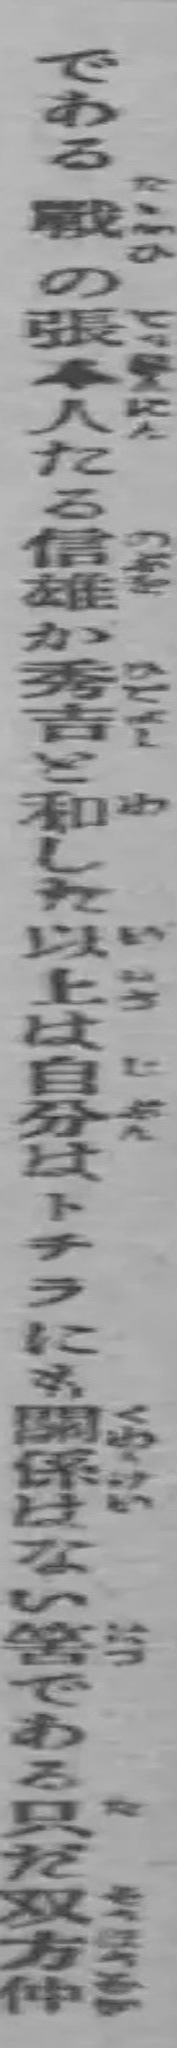である戦の張本人たる信雄か秀吉と和した以上は自分はトチラにも関係はない筈である只だ双方仲
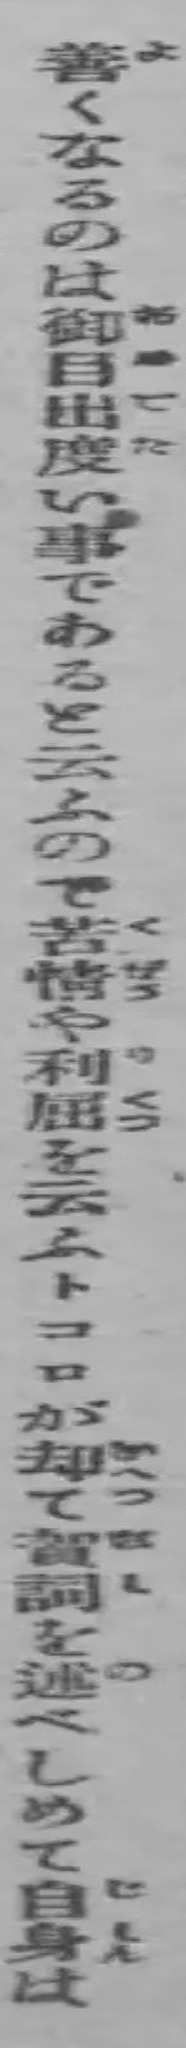善くなるのは御目出度い事であると云ふので苦情や利屈を云ふトコロが却て賀詞を述べしめて自身は
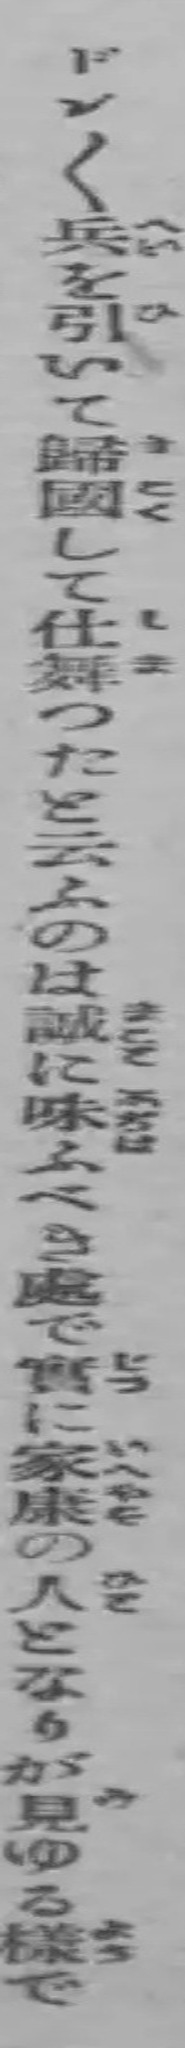ドン〳〵兵を引いて帰国して仕舞つたと云ふのは誠に味ふべき処で実に家康の人となりが見ゆる様で
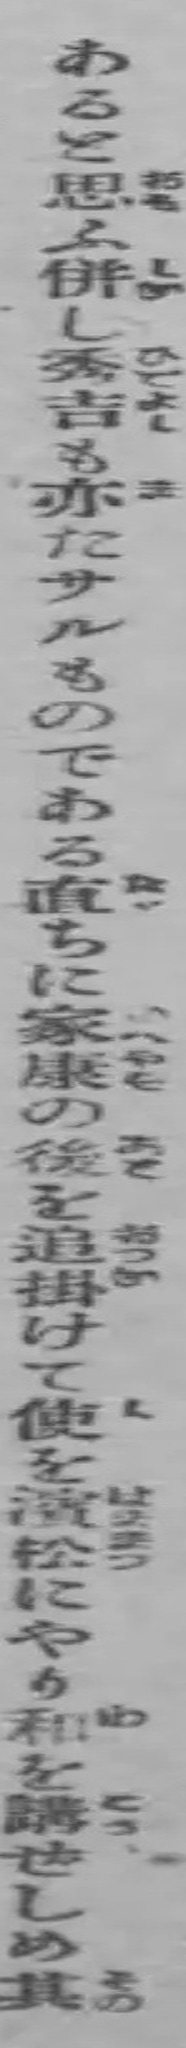あると思ふ併し秀吉も亦たサルものである直ちに家康の後を追掛けて使を浜松にやり和を講せしめ其
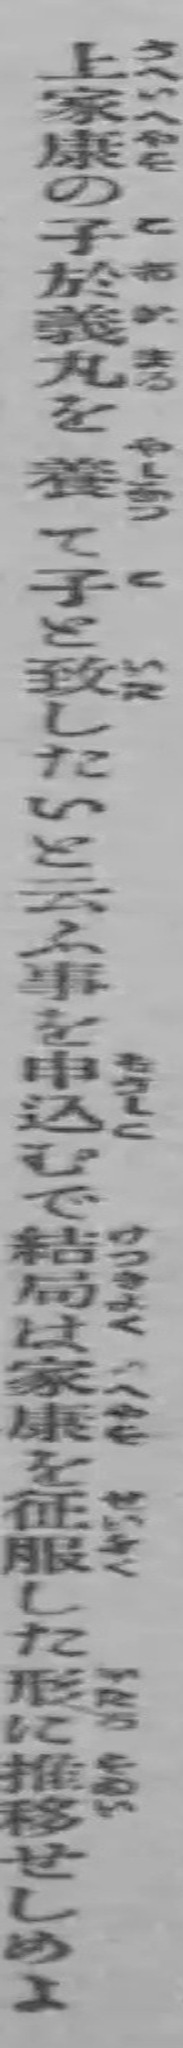上家康の子於義丸を養て子と致したいと云ふ事を申込むで結局は家康を征服した形に推移せしめよ
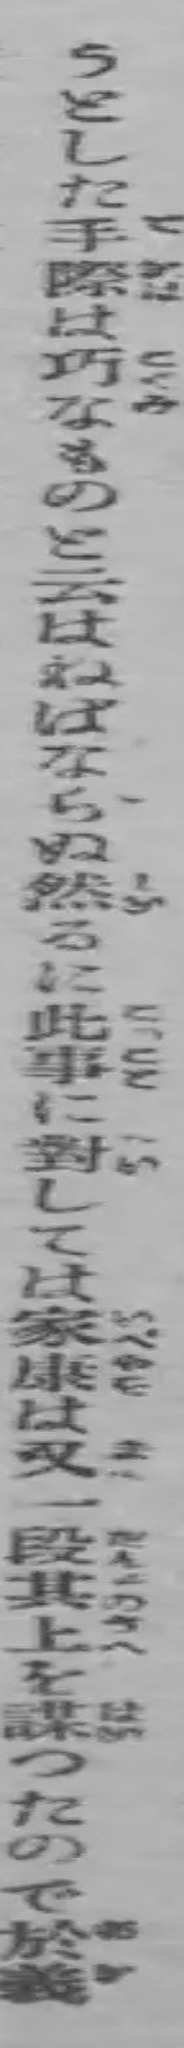うとした手際は巧なものと云はねばならぬ然るに此事に対しては家康は又一段其上を謀つたので於義
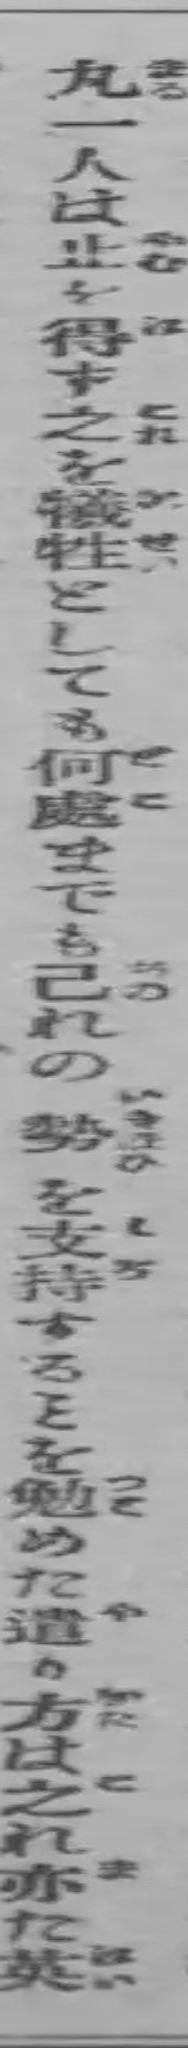丸一人は止を得ず之を犠牲としても何処までも己れの勢を支持することを勉めた遣り方は之れ亦た英
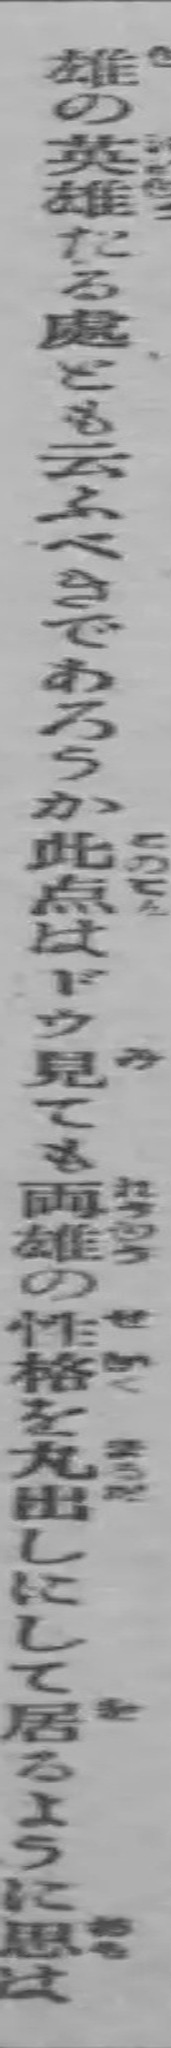雄の英雄たる処とも云ふべきであろうか此点がドウ見ても両雄の性格を丸出しにして居るように思は
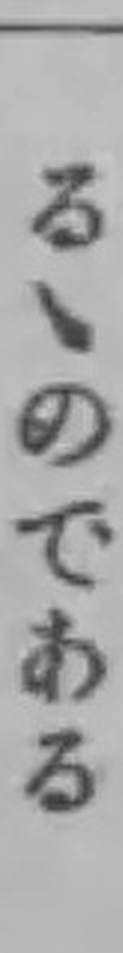るゝのである
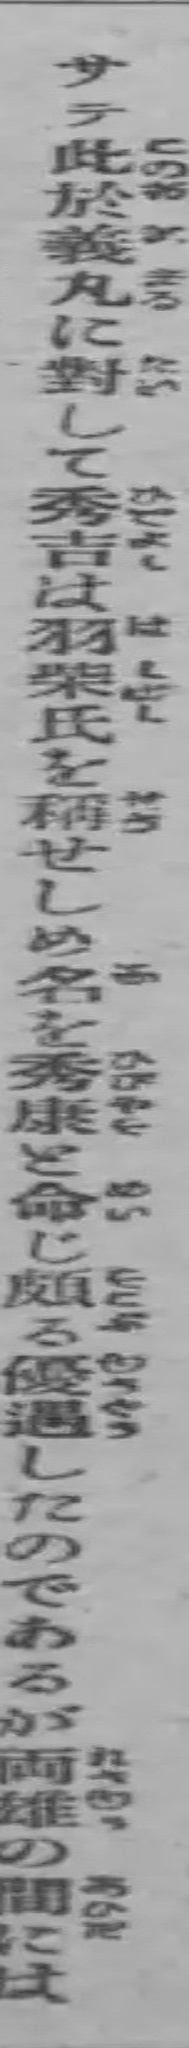サテ此於義丸に対して秀吉は羽柴氏を称せしめ名を秀康と命じ頗る優遇したのであるが両雄の間には
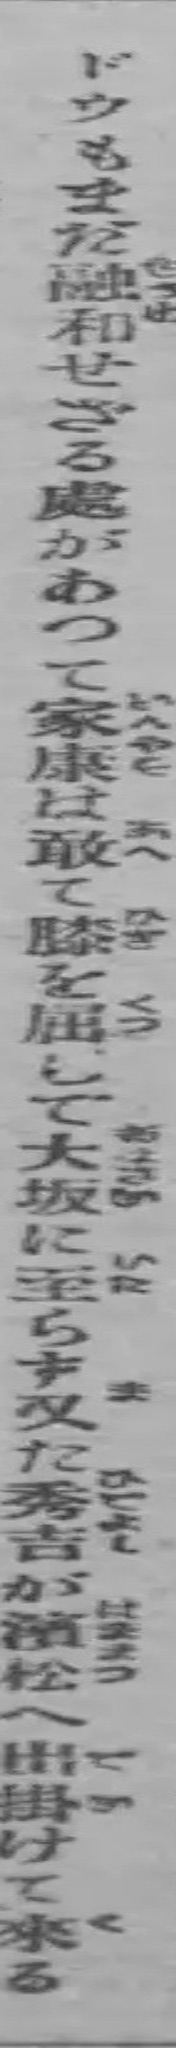ドウもまだ融和せざる処があつて家康は敢て膝を屈して大坂至らず又た秀吉が浜松に出掛けて来る
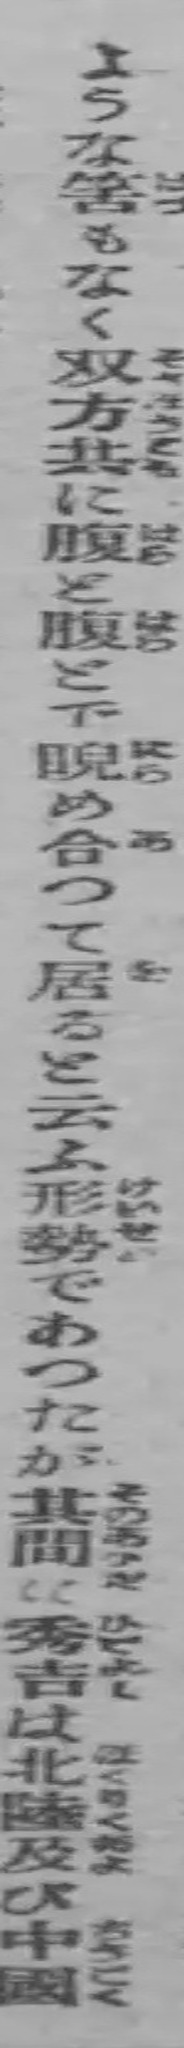ような筈もなく双方共に腹と腹とで睨め合つて居ると云ふ形勢であつたが其間に秀吉は北陸及び中国
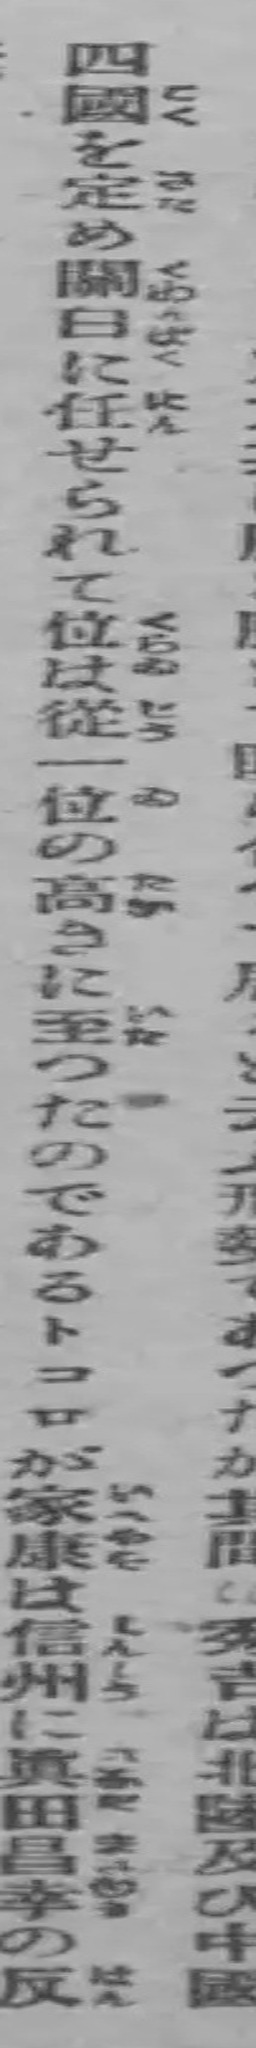四国を定め関白に任せられて位は従一位の高きに至つたのであるトコロが家康は信州に真田昌幸の反
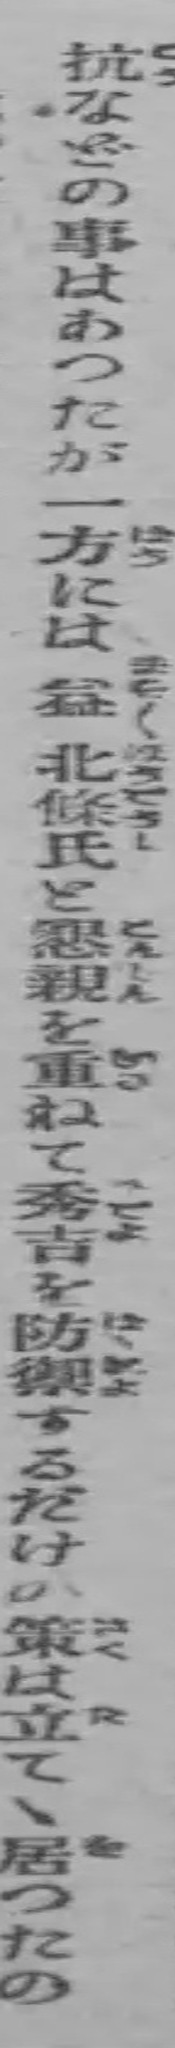抗などの事はあつたが一方には益北條氏と懇親を重ねて秀吉を防御するだけの策は立てゝ居つたの
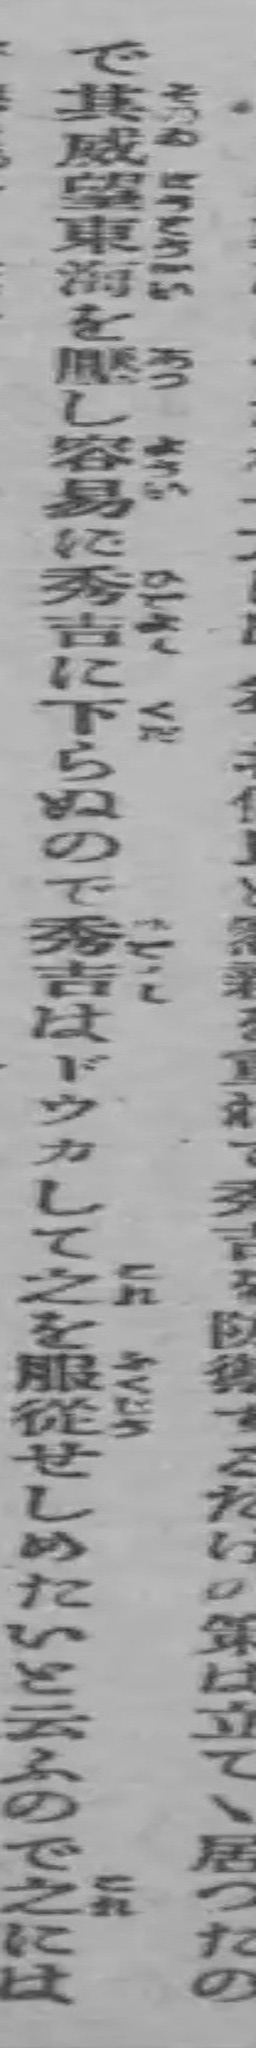で其威望東海を圧し容易に秀吉に下らぬので秀吉はドウカして之を服従せしめたいと云ふので之には
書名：豊橋市史談
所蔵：国立国会図書館 National Diet Library, JAPAN
